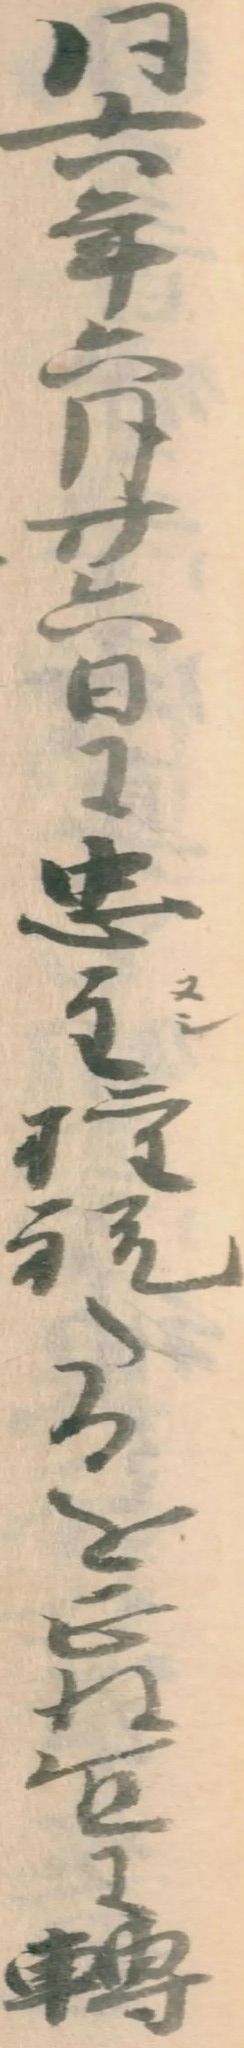同六年六月廿六日に忠主権祝たるを正ね宜に転
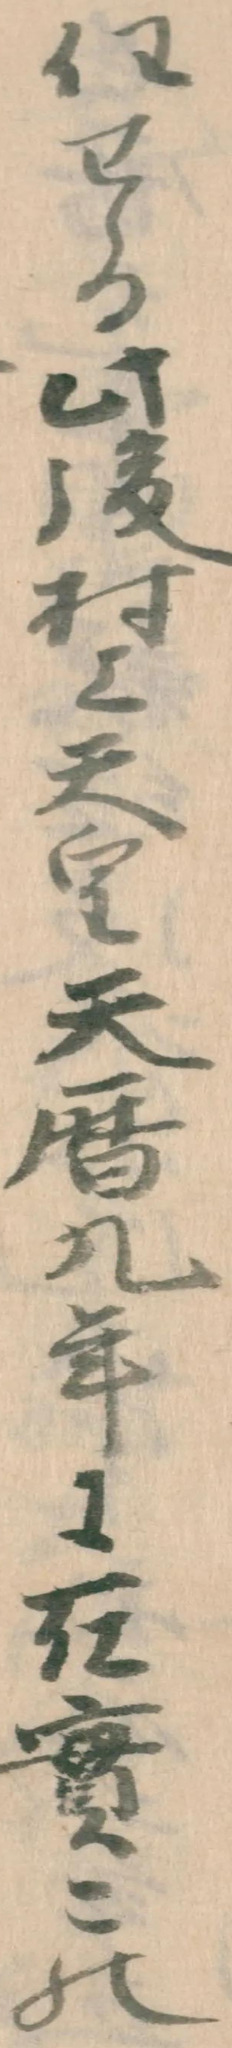任せらる此後村上天皇天暦九年に在実この
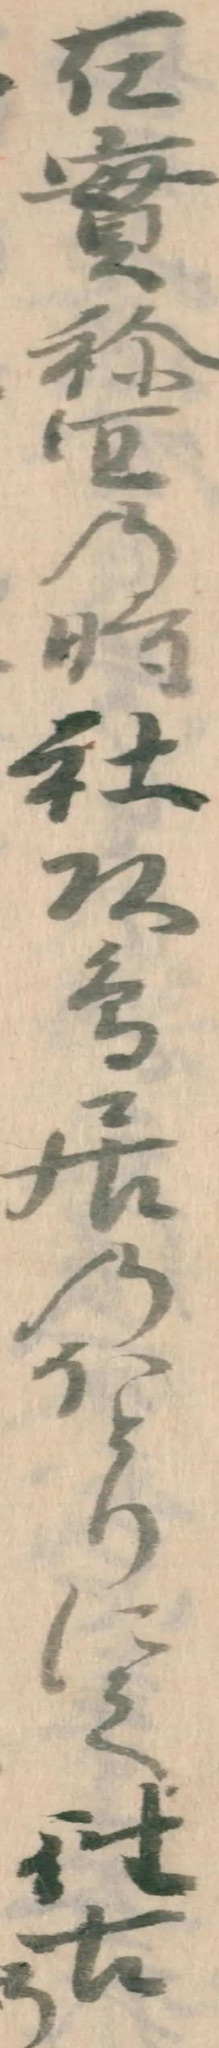在実祢宜の時社頭鳥居のほとりにて往古の
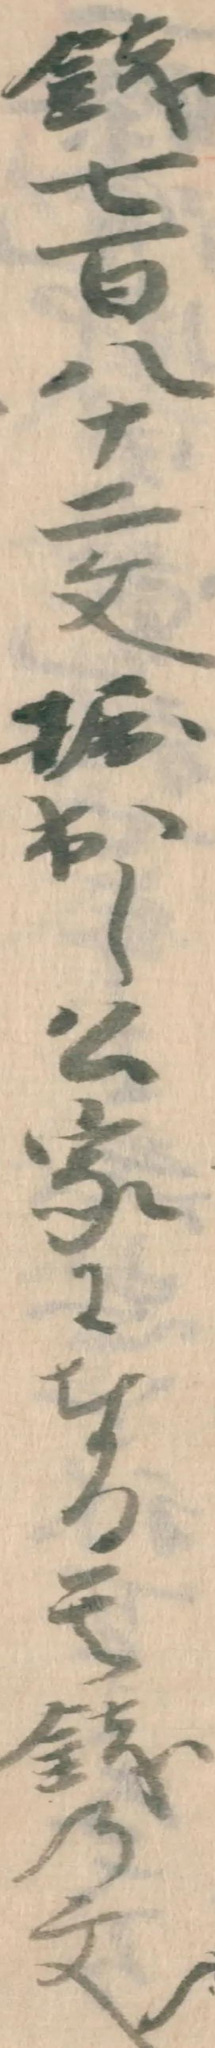銭七百八十二文掘出し公家に奉る其銭の文
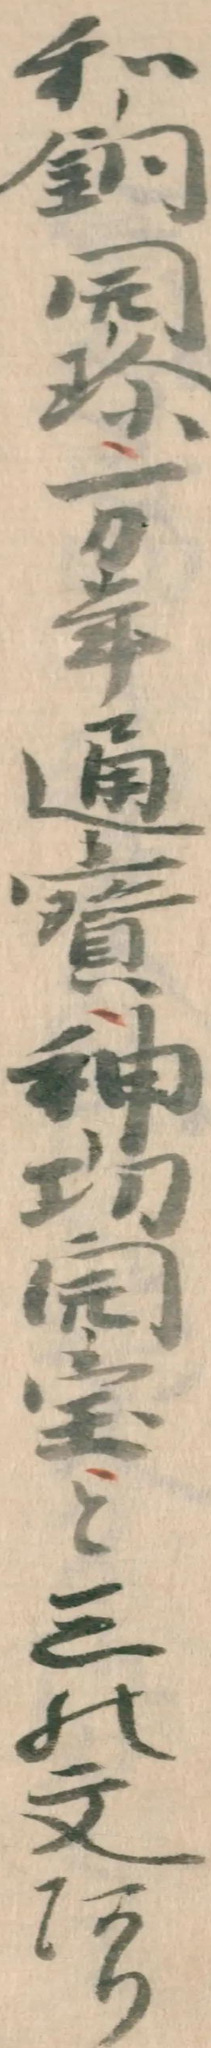和-銅開-珎、万年通宝、神-功開-宝、と三の文あり
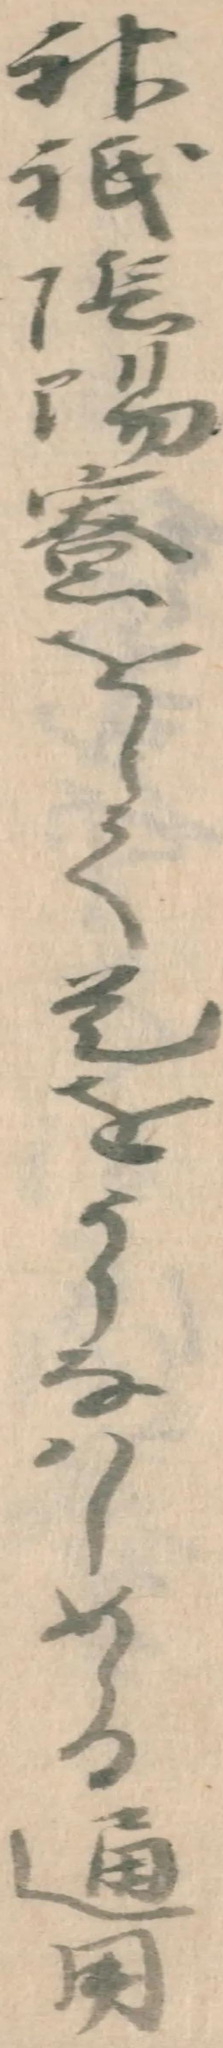神祇陰陽寮をして是をうらなはしめらる通用
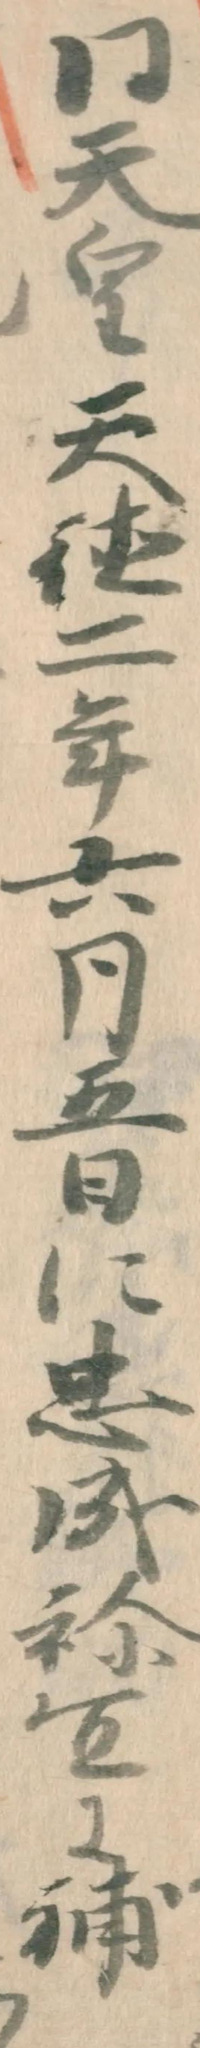同天皇天徳二年六月五日に忠成祢宜に補らる
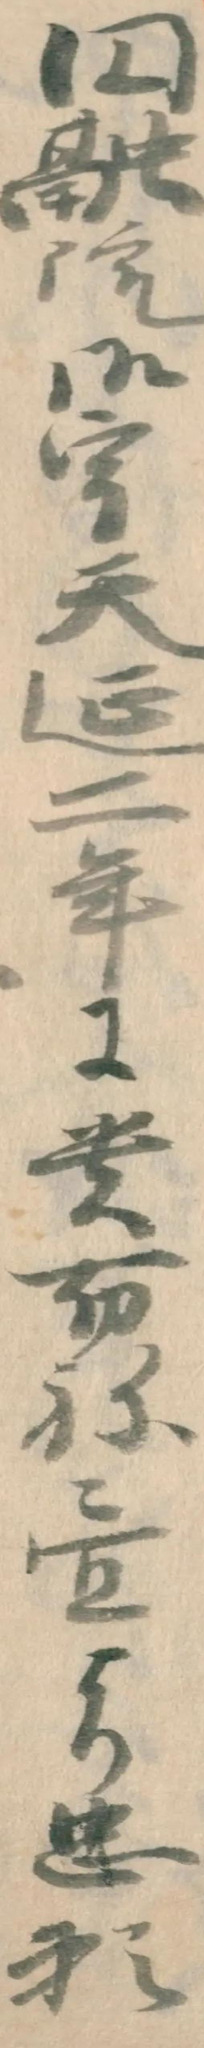円融院御宇天延二年に貴ふね祢宜より忠頼
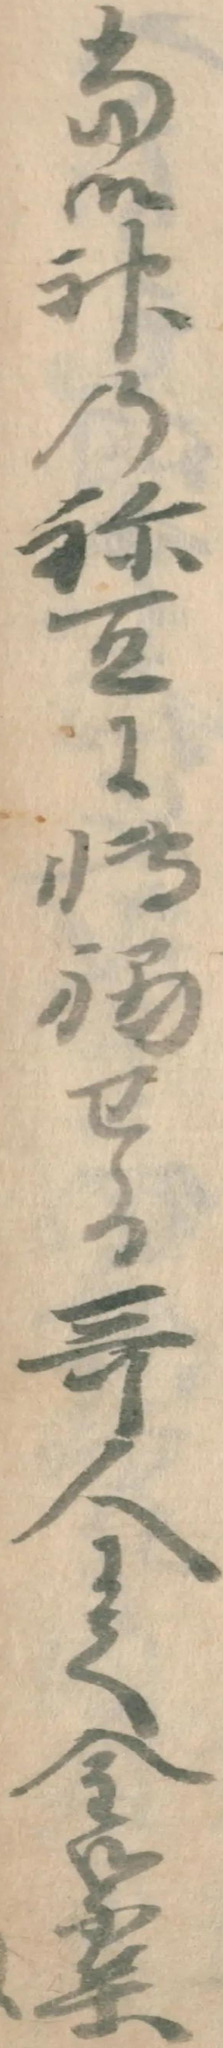当御神の称宜に転補せらる哥人にて金葉集に

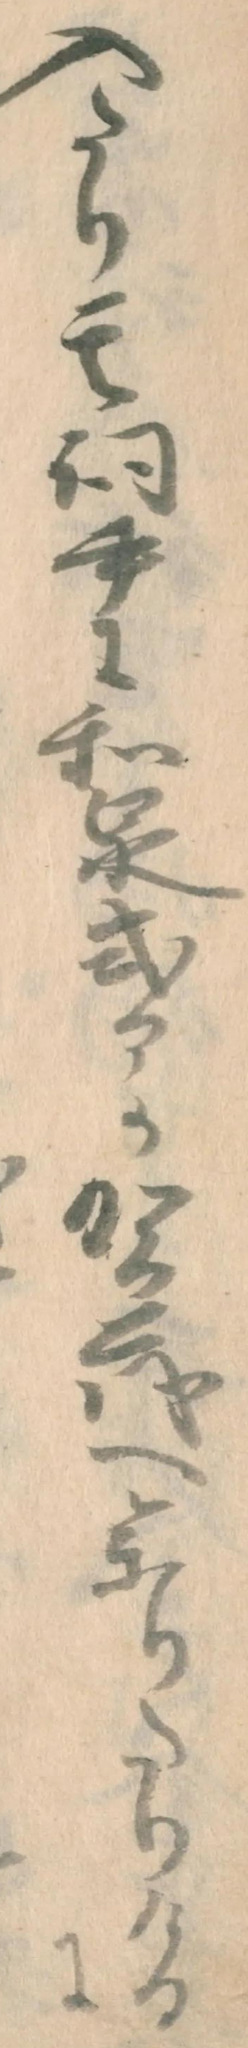入たり其詞書に和泉式部か賀茂へ参りたりけるに
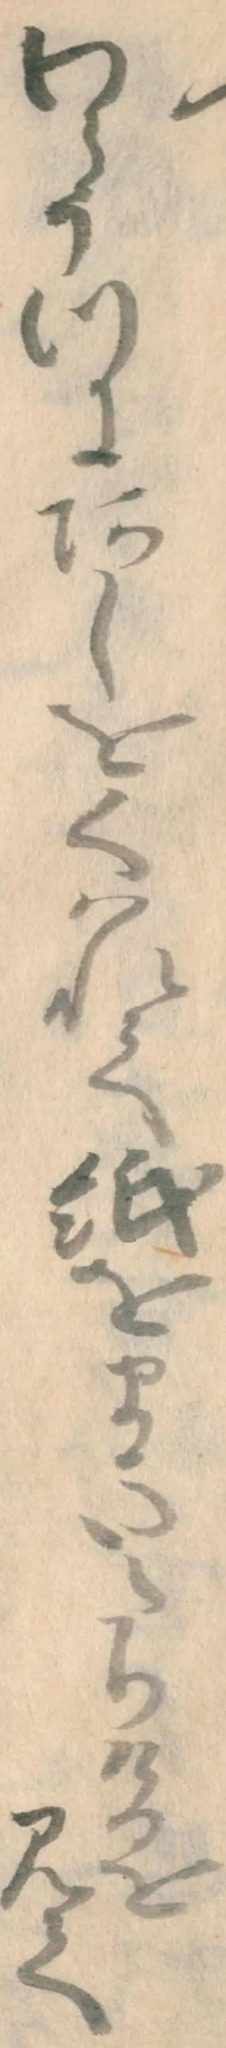わらうつにあしをくはれて紙をまきたりけるを見て
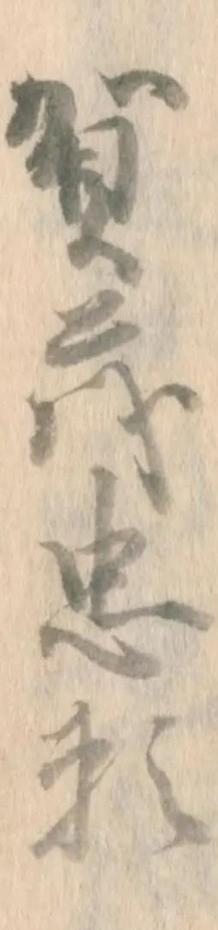賀茂忠頼
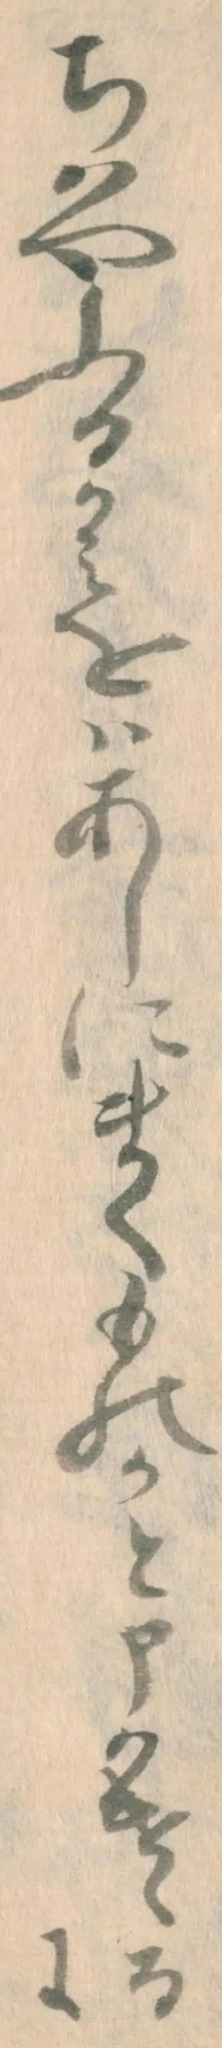ちはやふるかみをはあしにまくものかと申かけゝるに
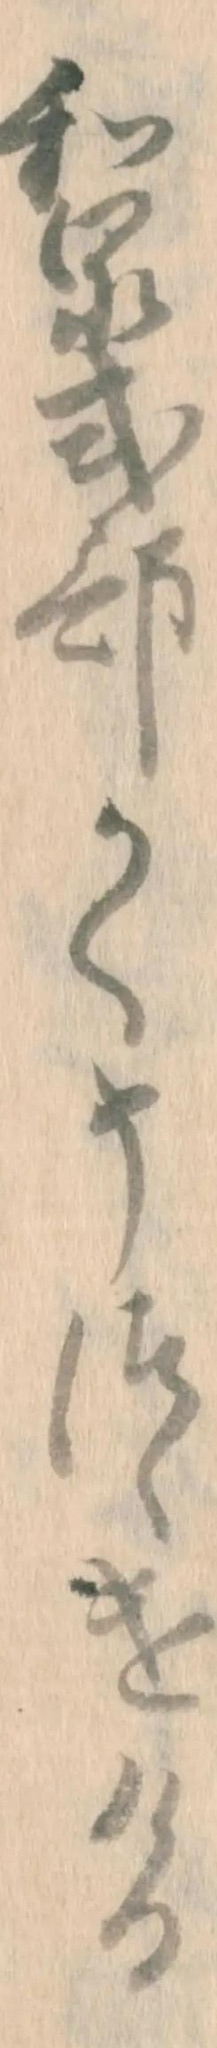和泉式部かくそつゝけける
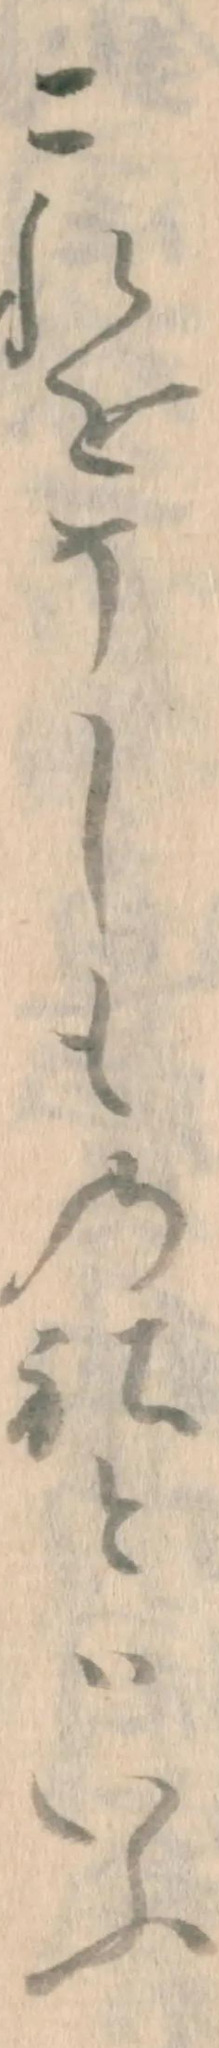これをそしもの社とはいふ
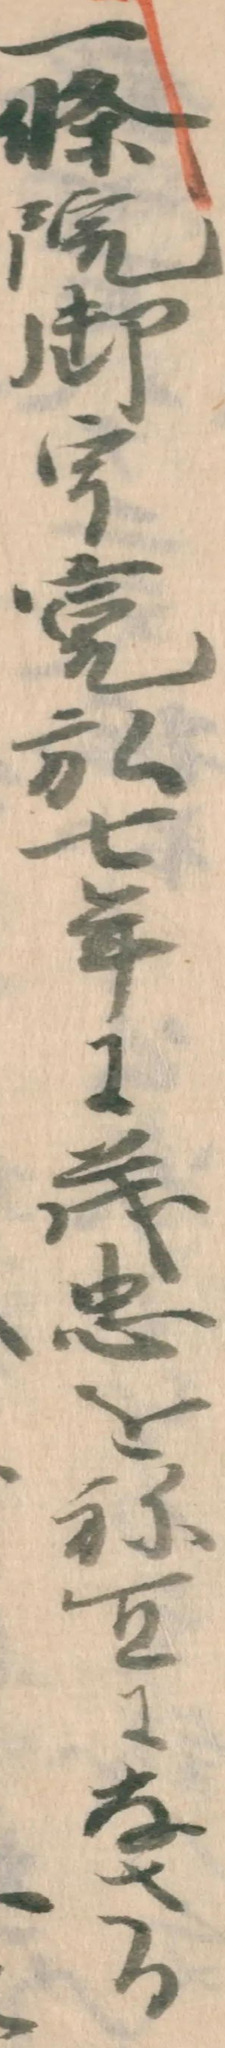一条院御宇寛弘七年に茂忠を称宜になさる
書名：賀茂社記録. 第1冊
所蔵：国立国会図書館 National Diet Library, JAPAN
